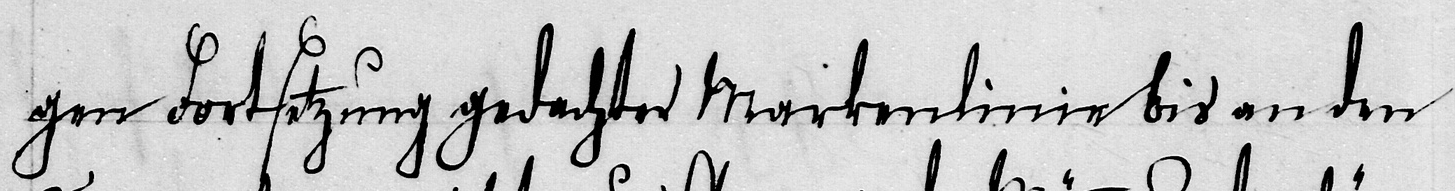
gen Fortsetzung gedachter Markenlinie bis an den
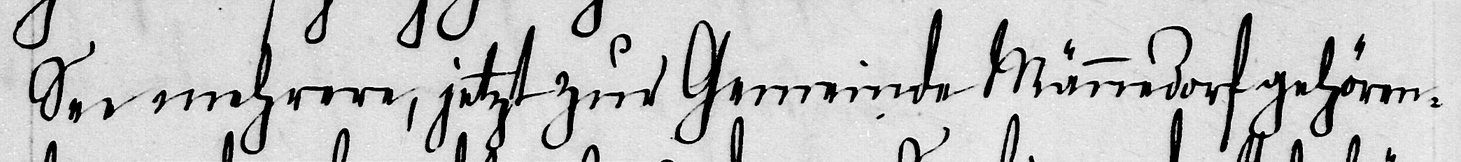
See mehrere, jetzt zur Gemeinde Männedorf gehören¬
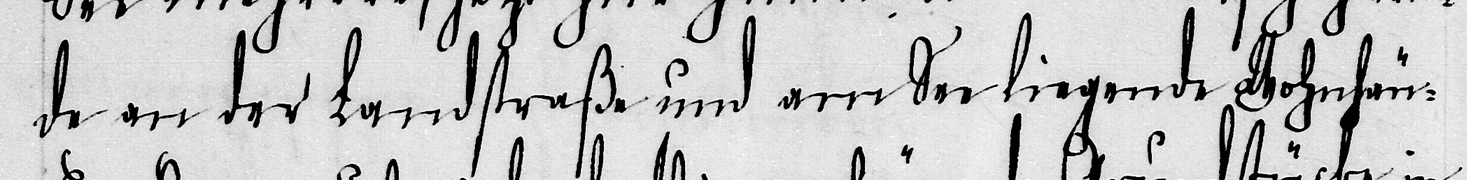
de an der Landstraße und am See liegende Wohnhäu¬
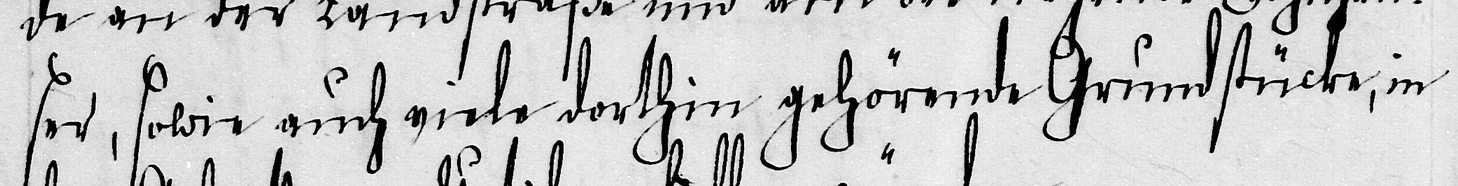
ser, sowie auch viele dorthin gehörende Grundstücke, in
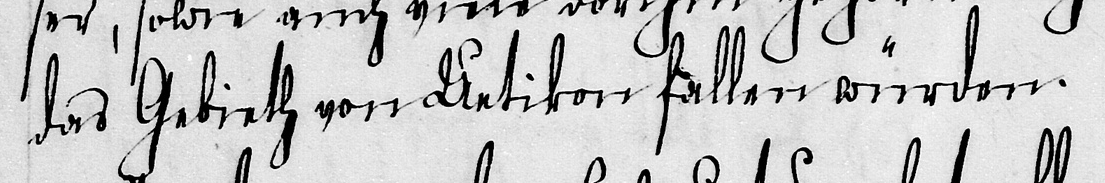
das Gebieth von Uetikon fallen würden.
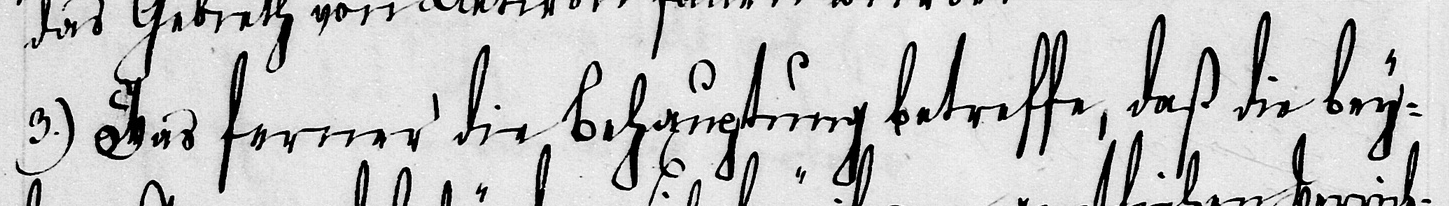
3.) Was ferner die Behauptung betreffe, daß die bey¬
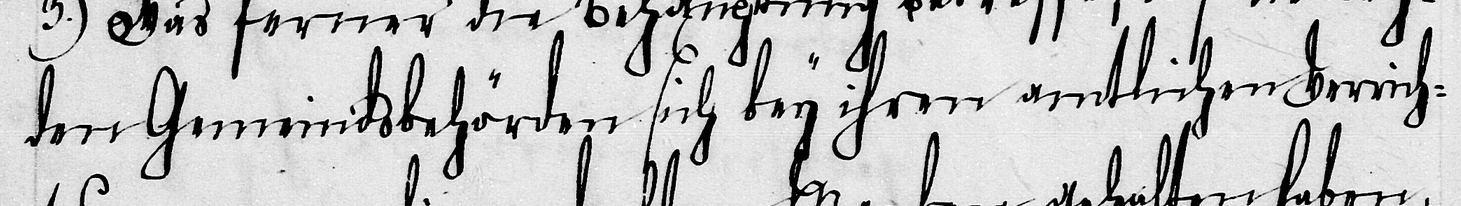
den Gemeindsbehörden sich bey ihren amtlichen Verric¬
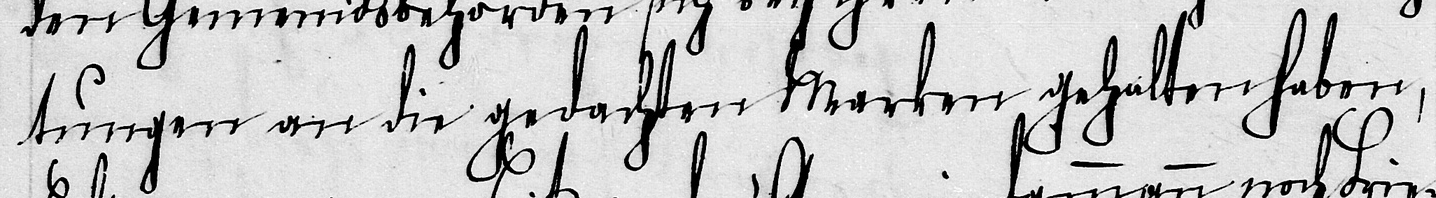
htungen an die gedachten Marken gehalten haben,
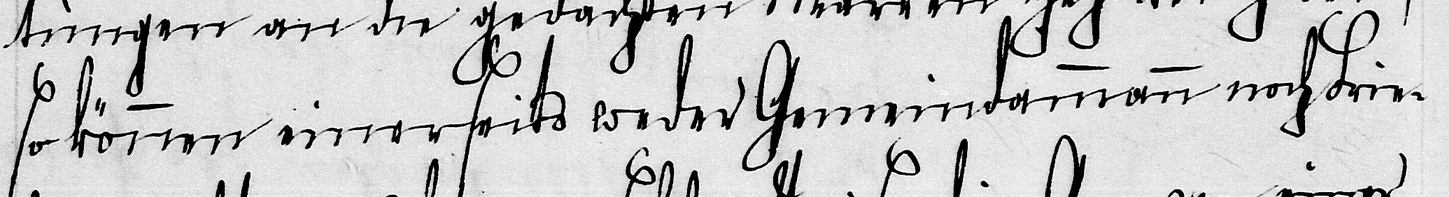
so können einerseits weder Gemeindammann noch Frie¬
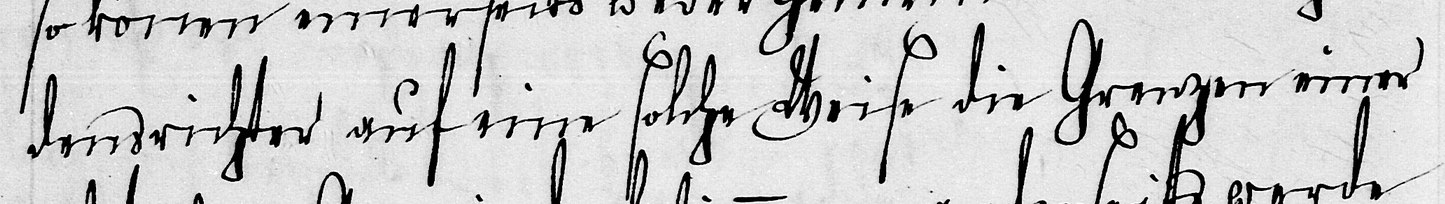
densrichter auf eine solche Weise die Grenzen einer
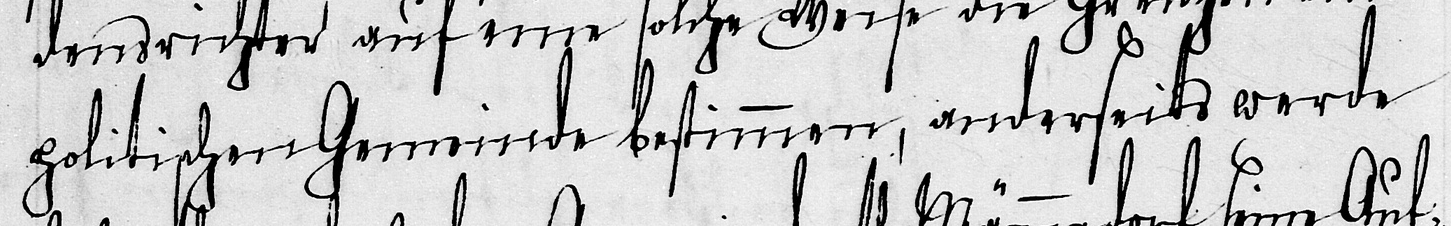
politischen Gemeinde bestimmen, anderseits werde
